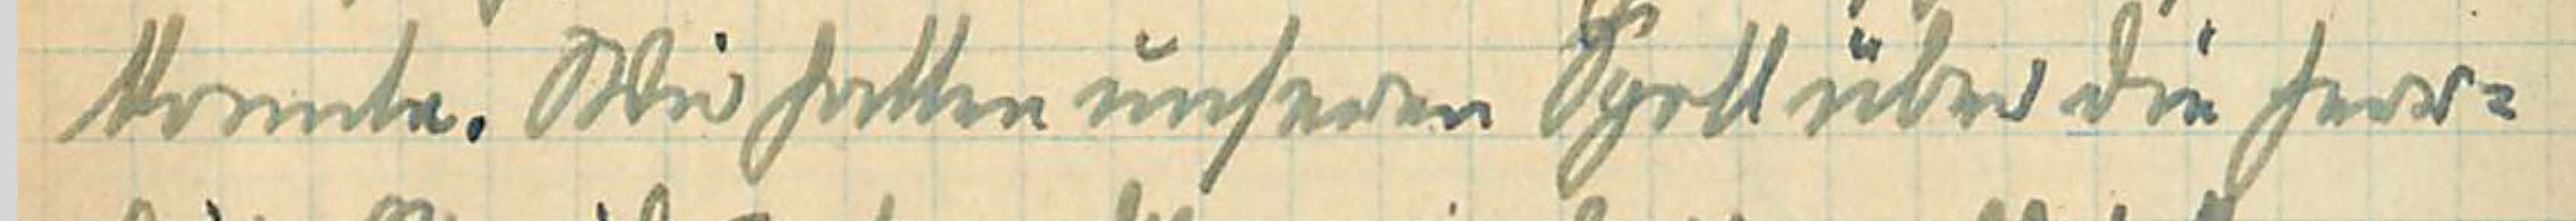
konnte. Wir hatten unseren Spott über die herr-
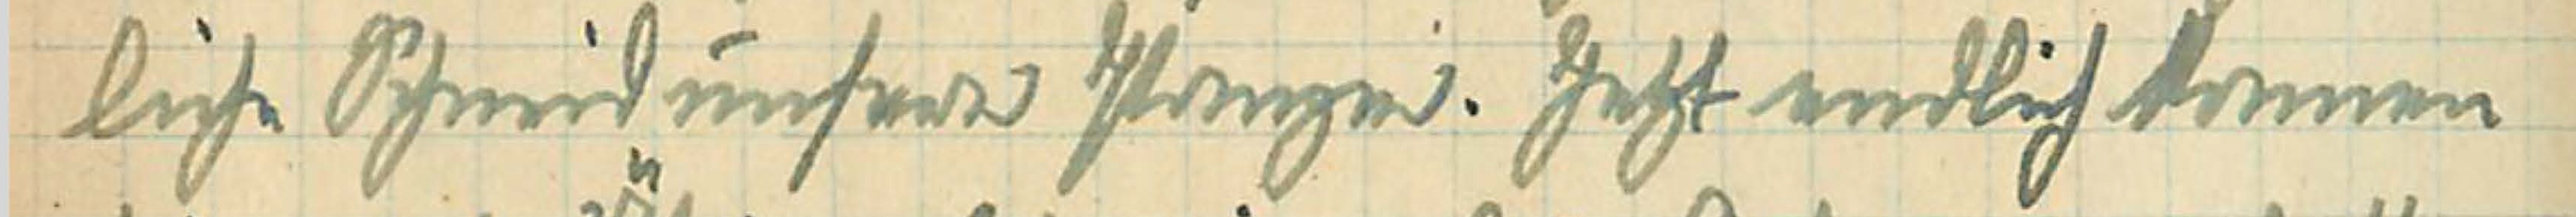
liche Schneid unserer Panzer. Jetzt endlich kamen
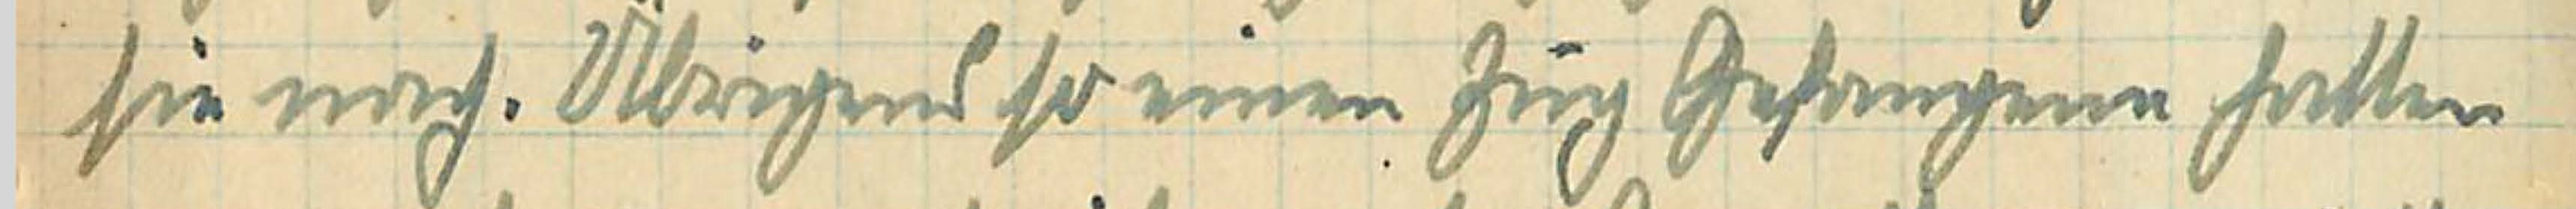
sie nach. Übrigens so einen Zug Gefangene hatten
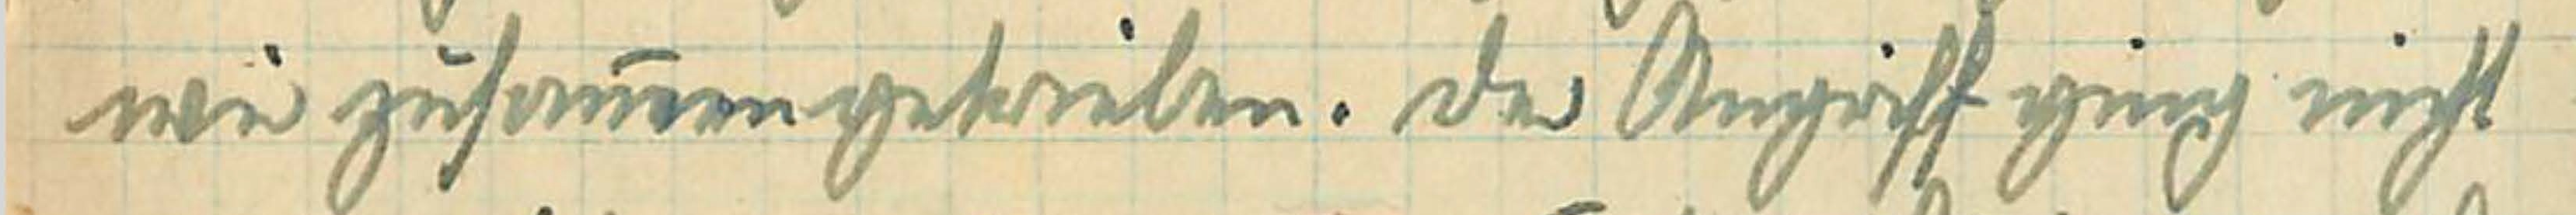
wir zusammengetrieben. Der Angriff ging nicht
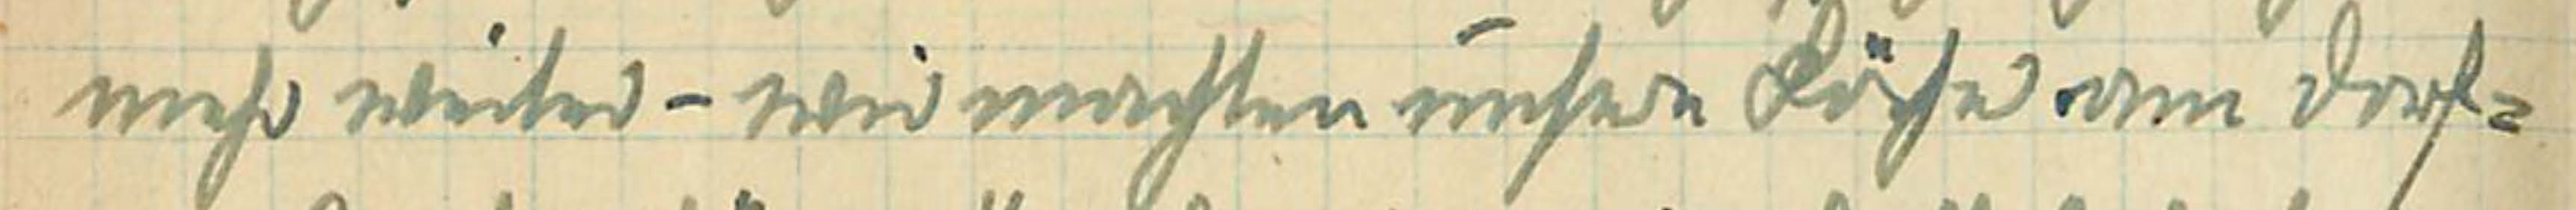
mehr weiter – wir machten unsere Löcher am Dorf-
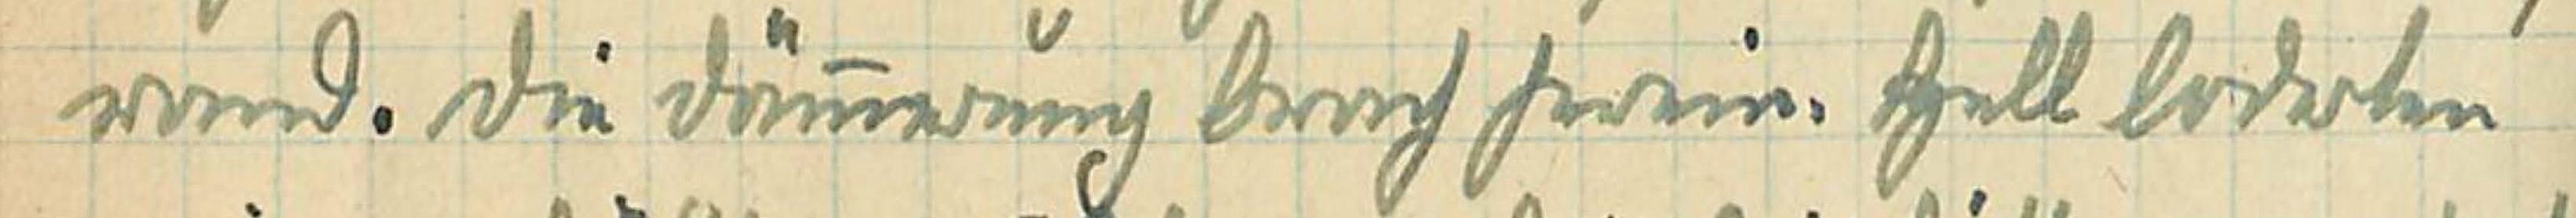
rand. Die Dämmerung brach herein. Hell loderten
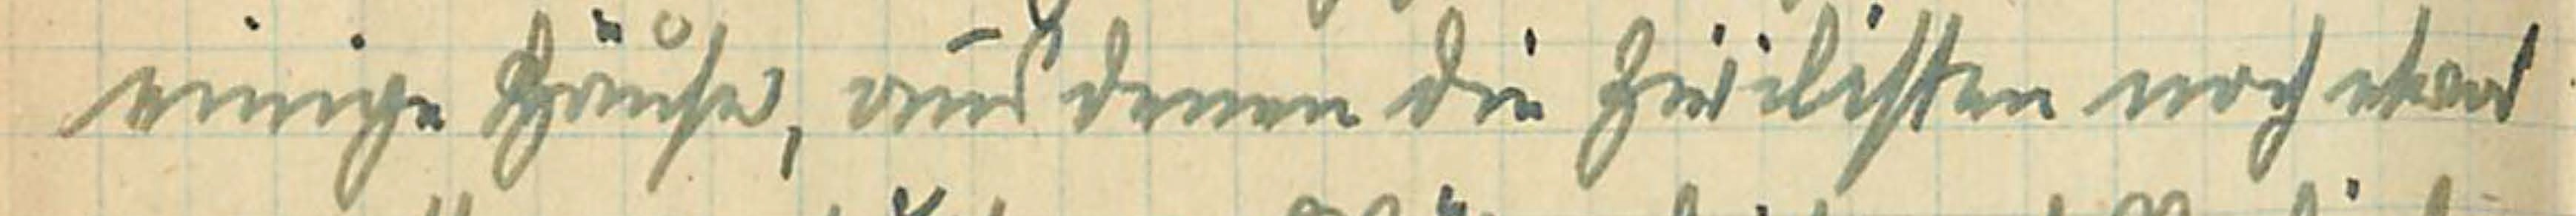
einige Häuser, aus denen die Zivilisten noch etwas
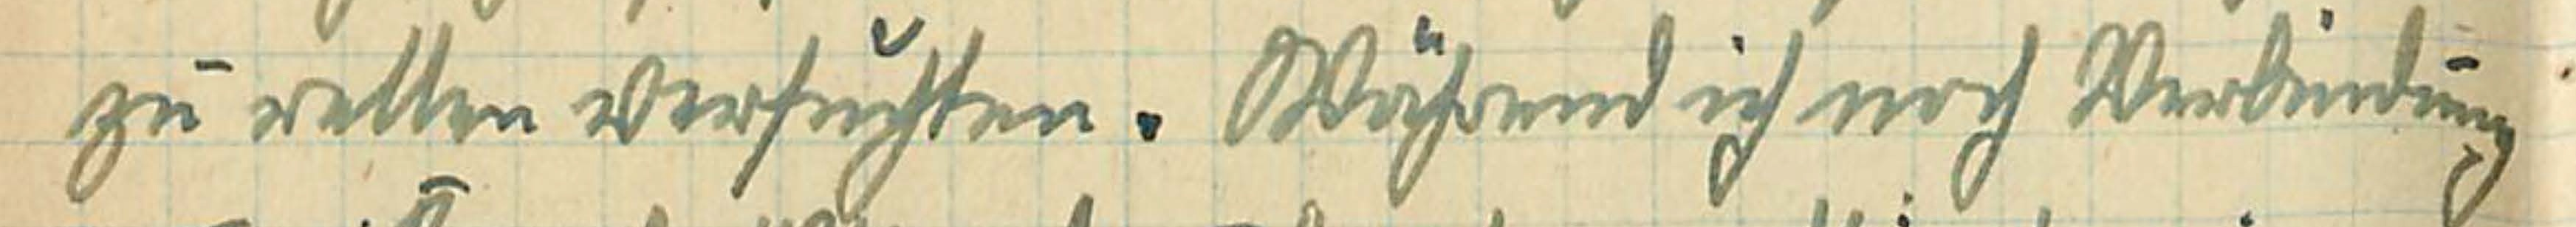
zu retten versuchten. Während ich noch Verbindung
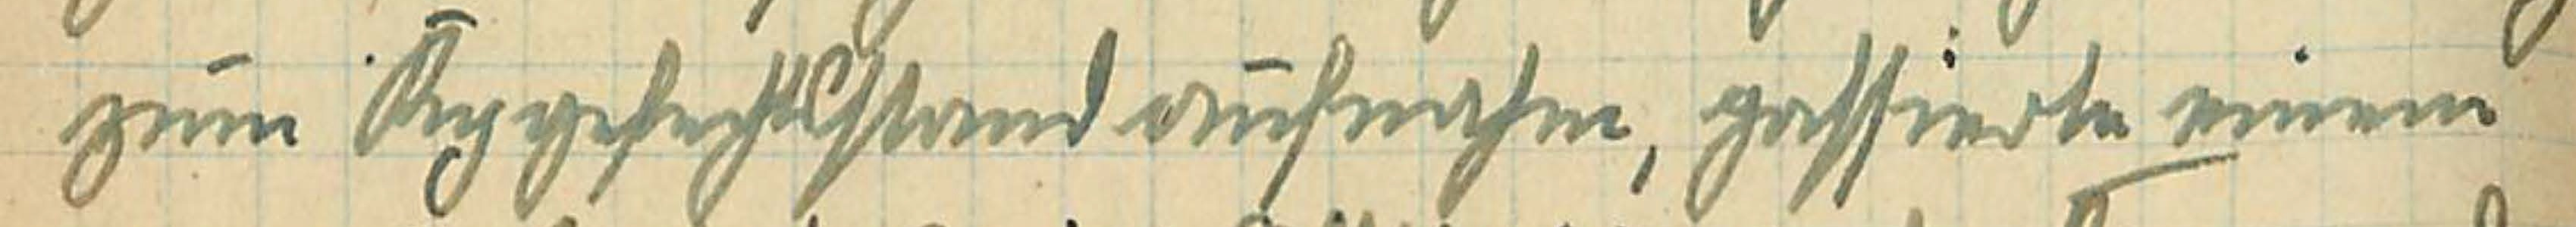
zum Kpgefechtsstand aufnahm, passierte einem
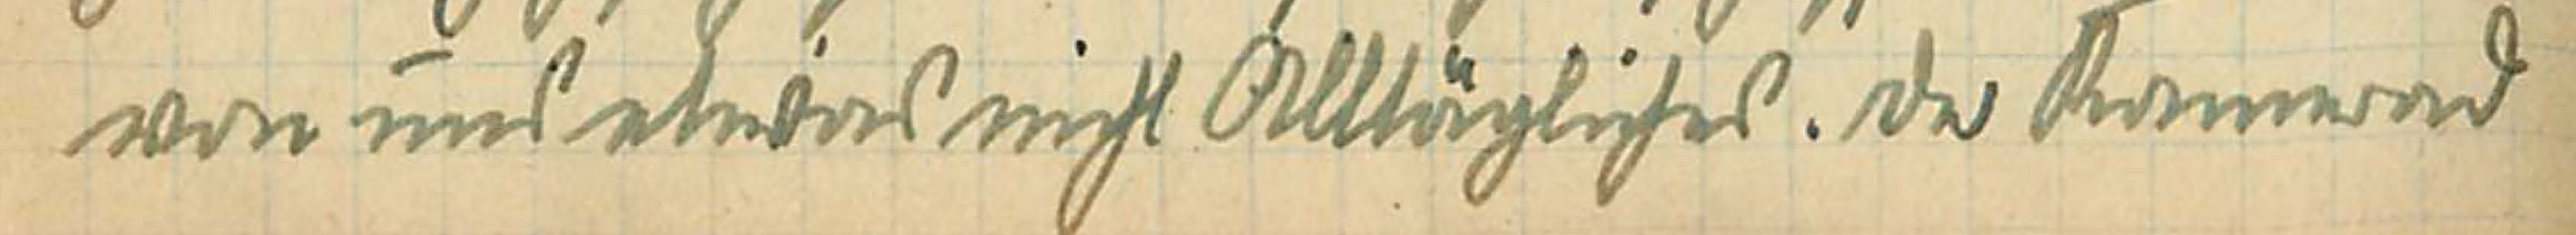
von uns etwas nicht Alltägliches. Der Kamerad
